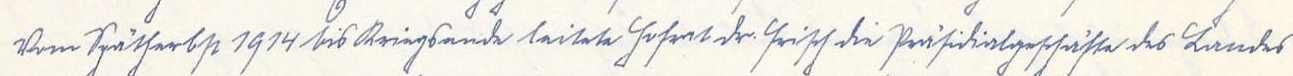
Vom Spätherbst 1914 bis Kriegsende leitete Hofrat Dr. Frisch die Präsidialgeschäfte des Landes
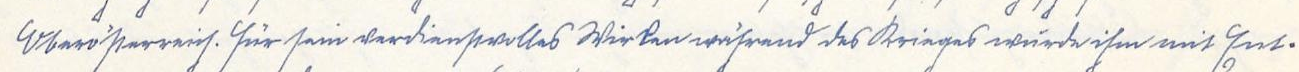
Oberösterreich. Für sein verdienstvolles Wirken während des Krieges wurde ihm mit Ent-
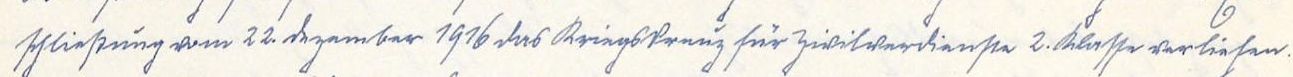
schließung vom 22. Dezember 1916 das Kriegskreuz für Zivilverdienste 2. Klasse verliehen.
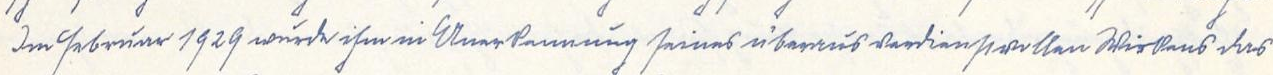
Im Februar 1929 wurde in Anerkennung seines überaus verdienstvollen Wirkens das
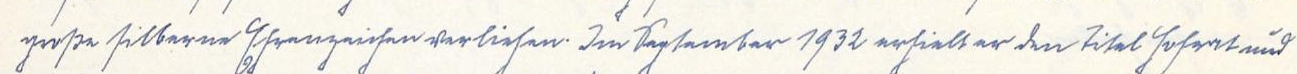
große silberne Ehrenzeichen verliehen. Im September 1932 erhielt er den Titel Hofrat und die
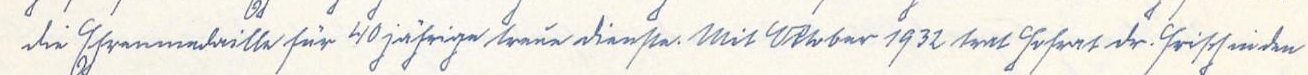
Ehrenmedaille für 40 jährige treue Dienste. Mit Oktober 1932 trat Hofrat Dr. Frisch in den
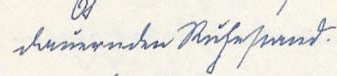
dauernden Ruhestand.
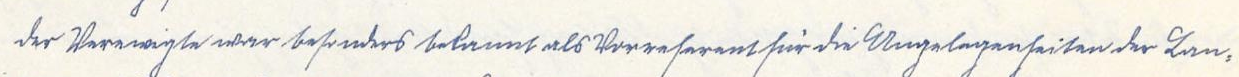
Der Verewigte war besonders bekannt als Vorreferent für die Angelegenheiten der Lan-
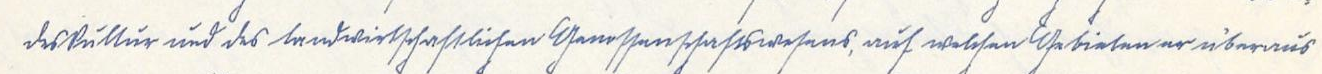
deskultur und des landwirtschaftlichen Genossenschaftswesens, auf welchen Gebieten erüber
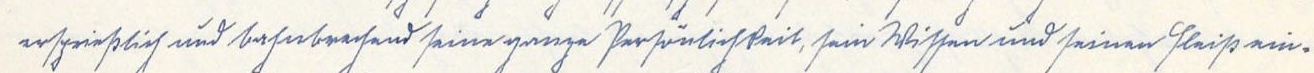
ersprießlich und bahnbrechend seine ganze Persönlichkeit, sein Wissen und seinen Fleiß ein-
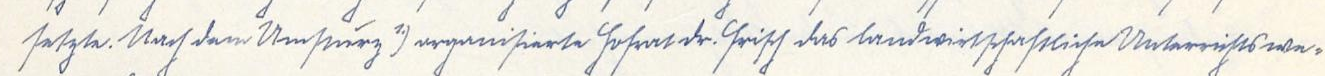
setzte. Nach dem Umsturz organisierte Hofrat Dr. Frisch das landwirtschaftliche Unterrichtswe
